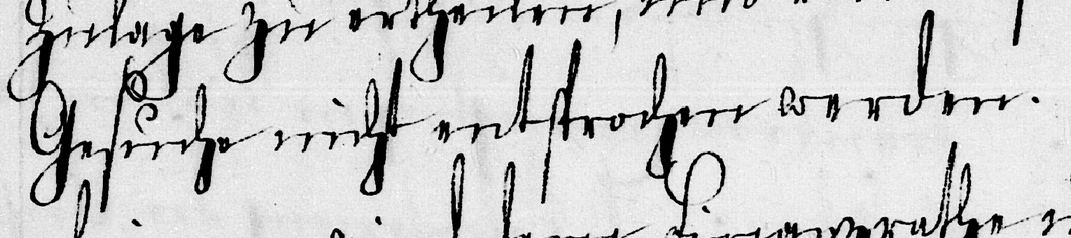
Gesuche nicht entsprochen werden.
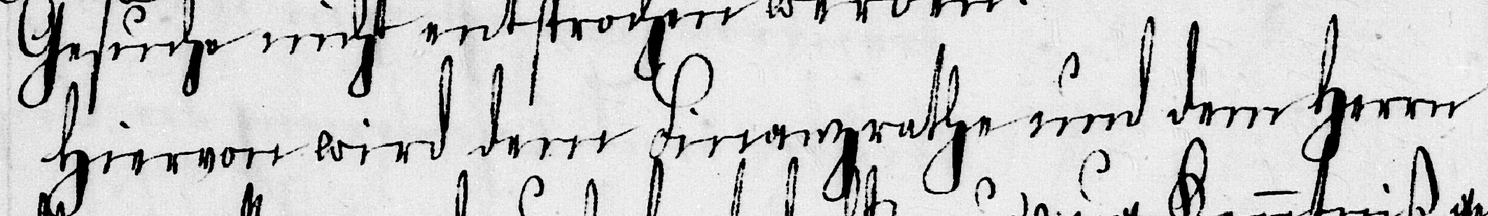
Hiervon wird dem Finanzrathe und dem Herrn
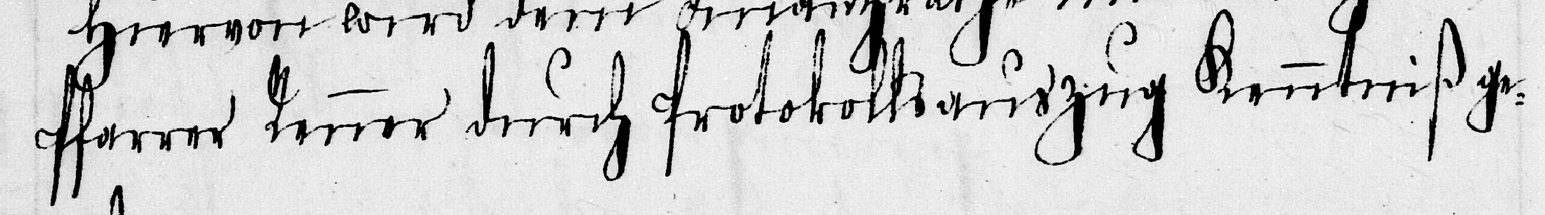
Pfarrer Renner durch Protokollsauszug Kenntniß ge¬
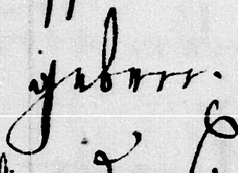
geben.
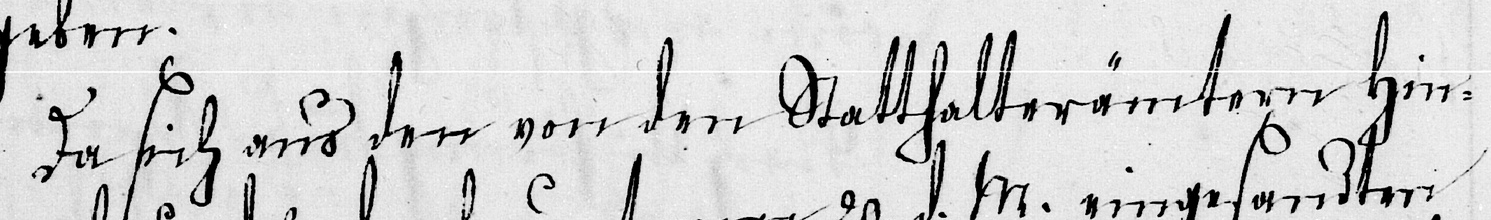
Da sich aus den von den Statthalterämtern Hin¬
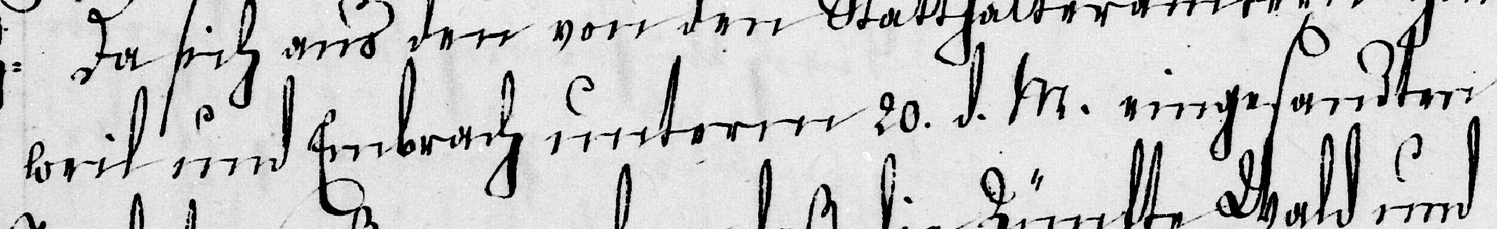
weil und Embrach unterm 20. d. M. eingesandten
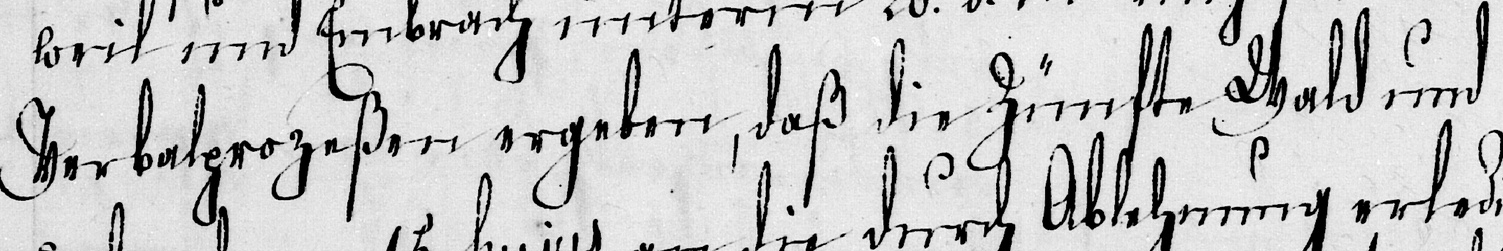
Verbalprozeßen ergeben, daß die Zünfte Wald und
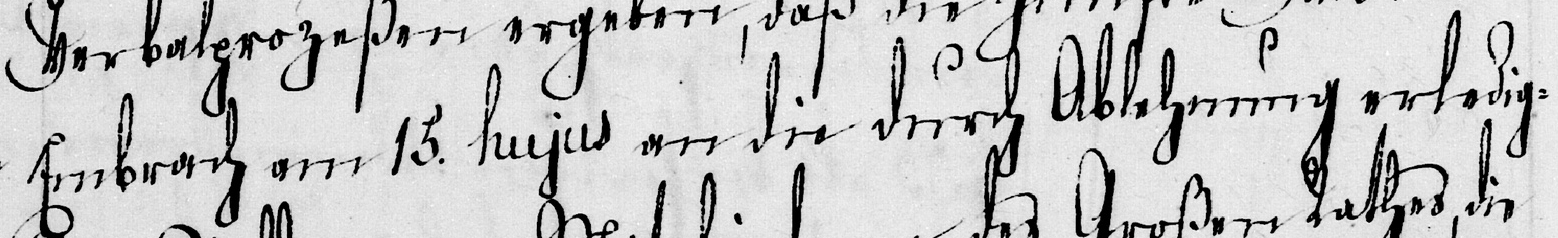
Embrach am 15. hujus an die durch Ablehnung erledi¬
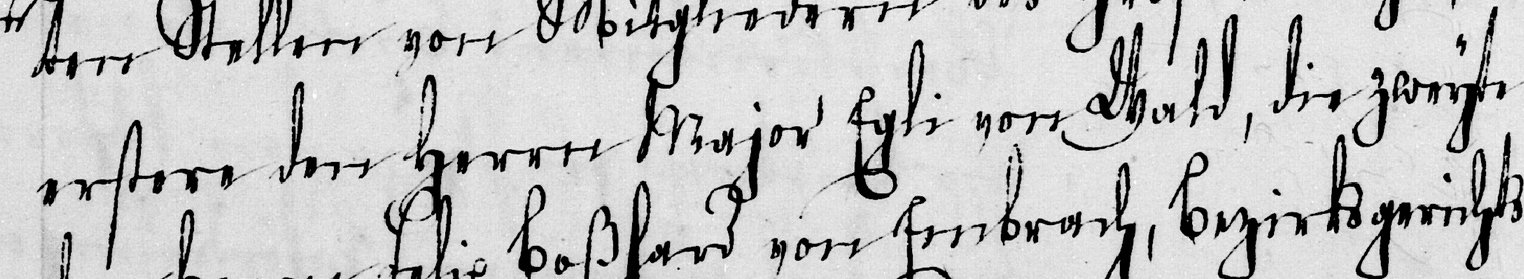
erstere den Herrn Major Egli von Wald, die zweyte
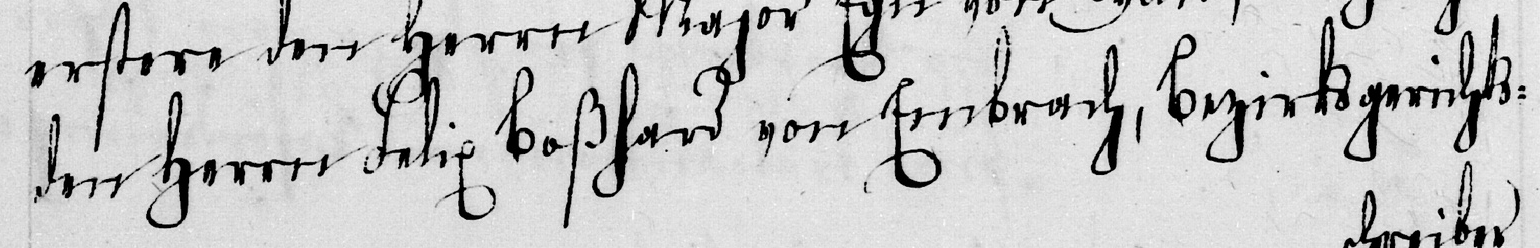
den Herrn Felix Boßhard von Embrach, Bezirksgericht¬
